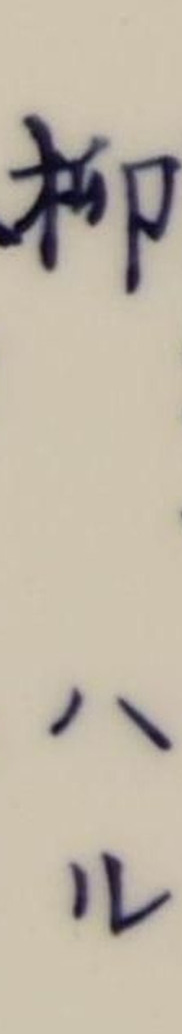柳ハル
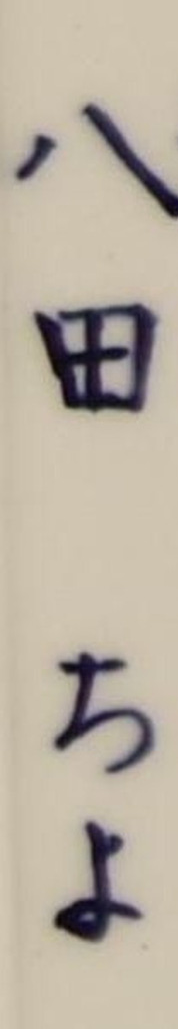八田ちよ

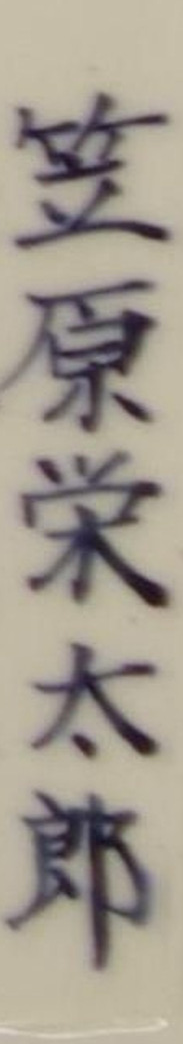笠原栄太郎
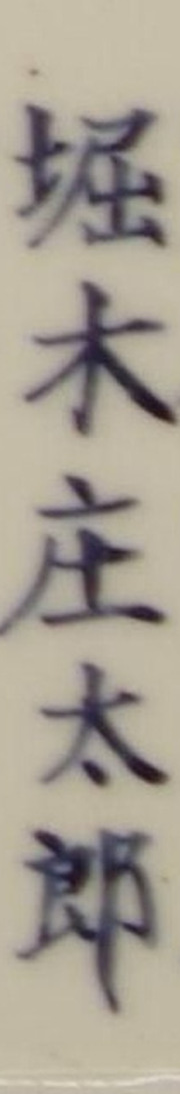堀木庄太郎
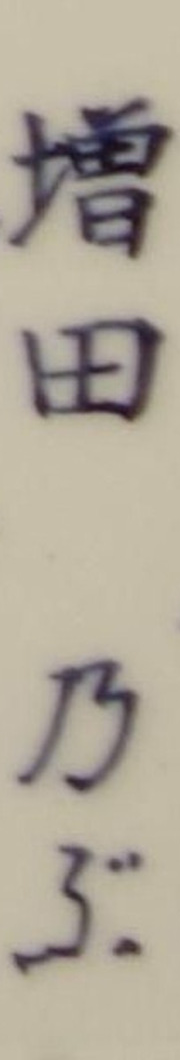増田のぶ
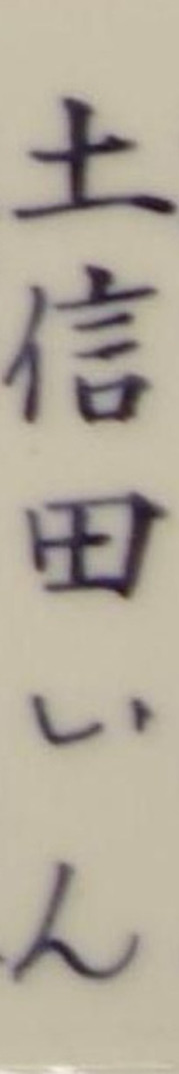土信田いん
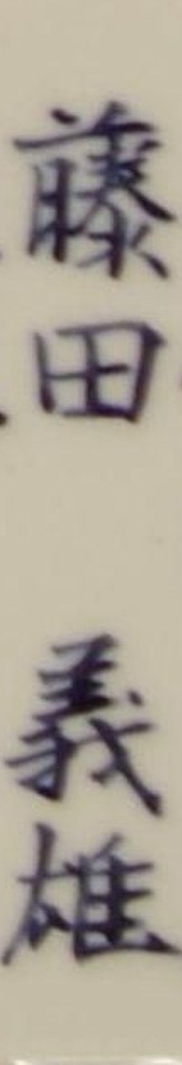藤田義雄
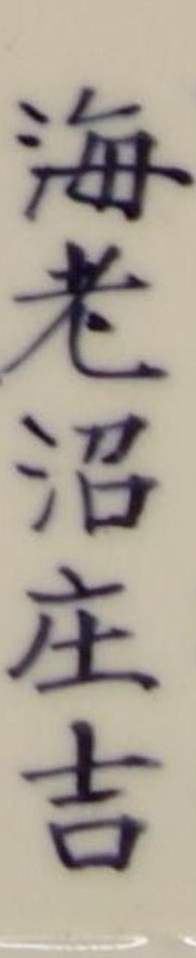海老沼庄吉
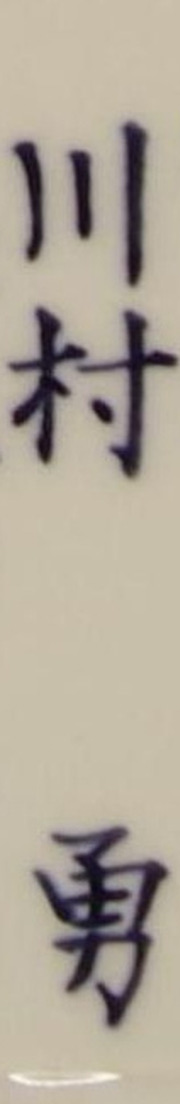川村勇
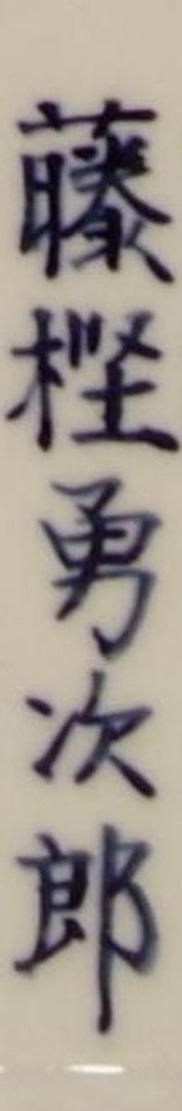藤樫勇次郎
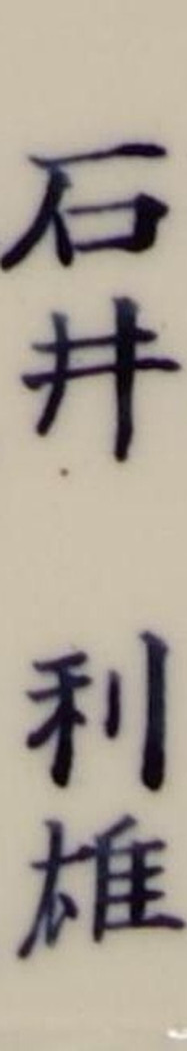石井利雄
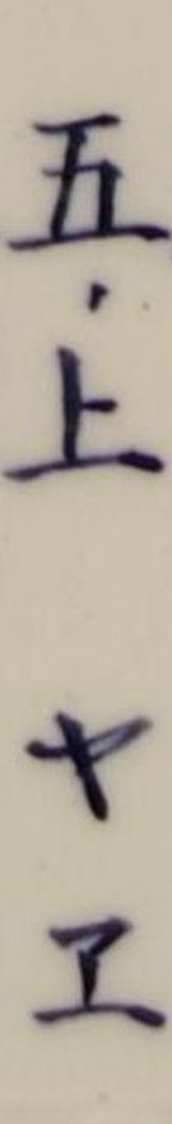五ノ上ヤエ
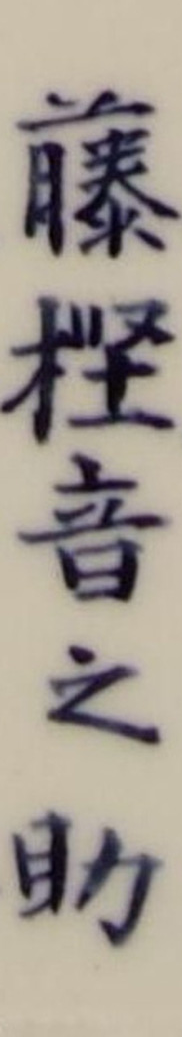藤樫音之助
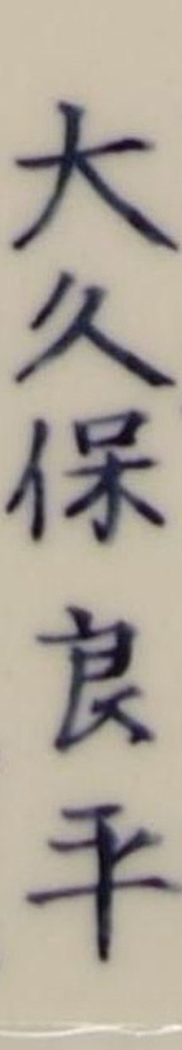大久保良平
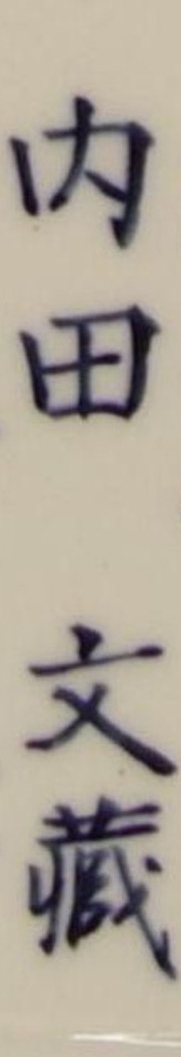内田文蔵
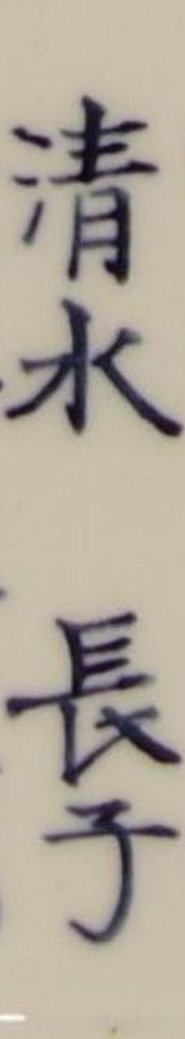清水長子
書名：M~S
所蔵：高野山金剛峯寺
